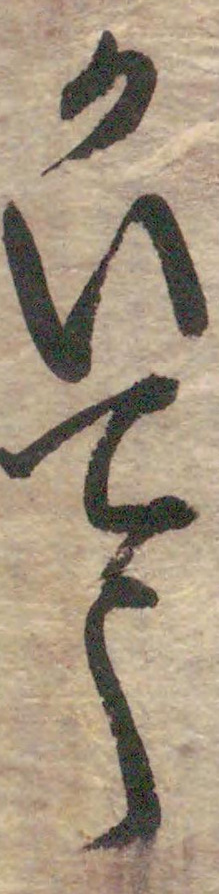かいてう

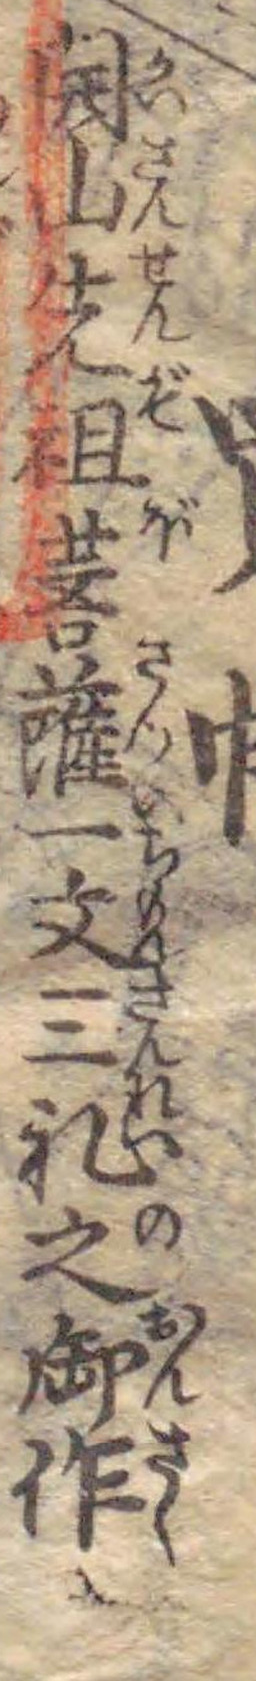開山先祖菩薩一文三礼之御作
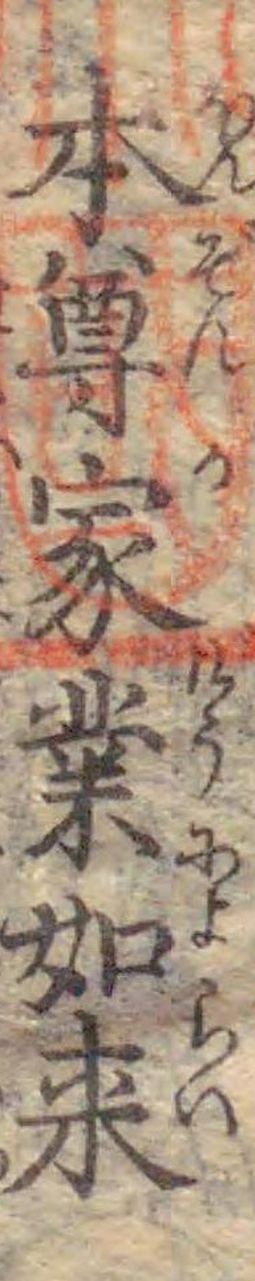本尊家業如来
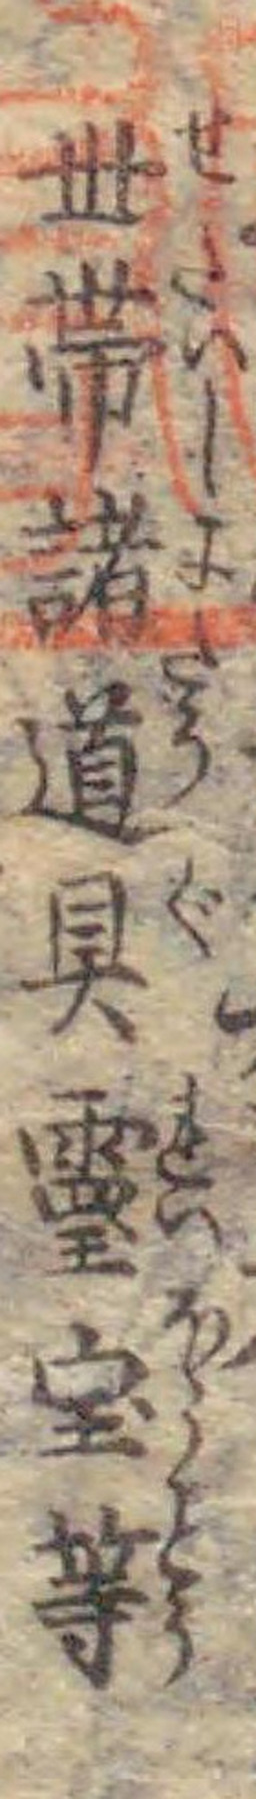世帯諸道具霊宝等
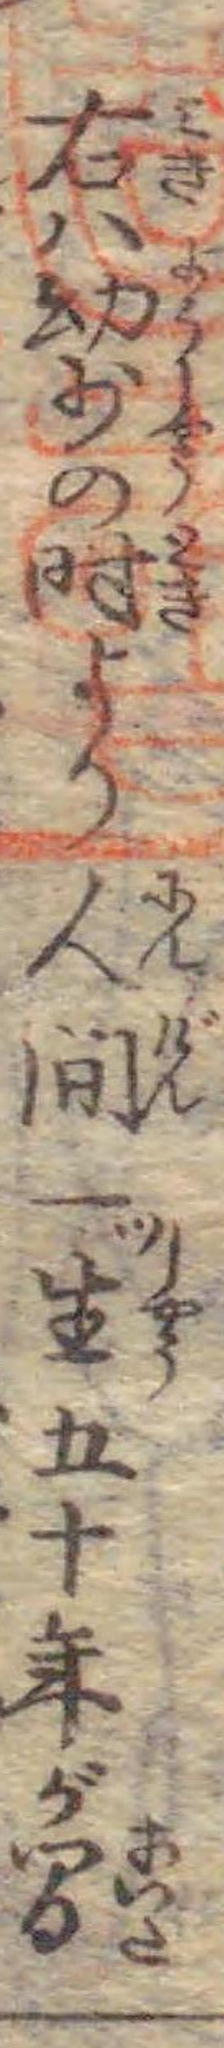右は幼少の時より人間一ッ生五十年が間
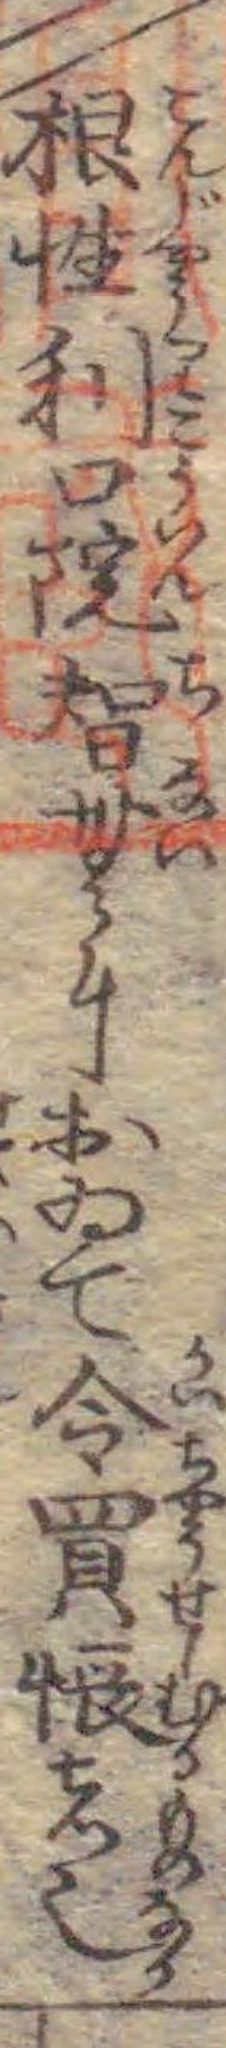根性利口院智無におゐて令買帳者也

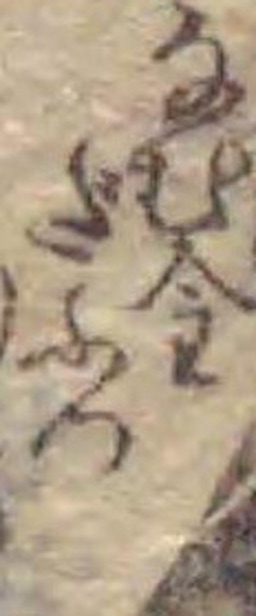だふつ
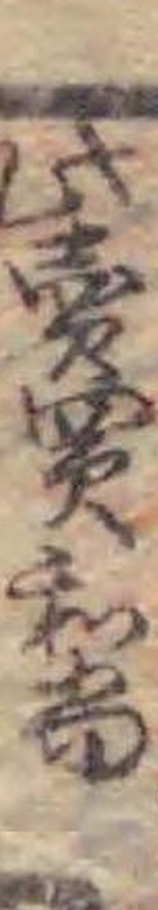此売買和尚
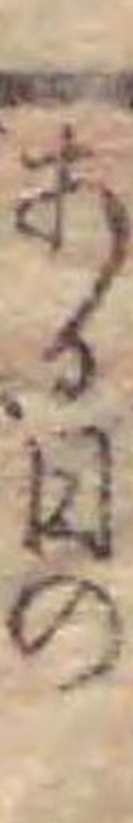ある日の
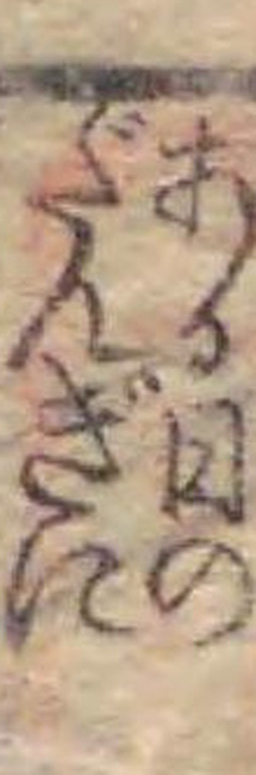だんぎに
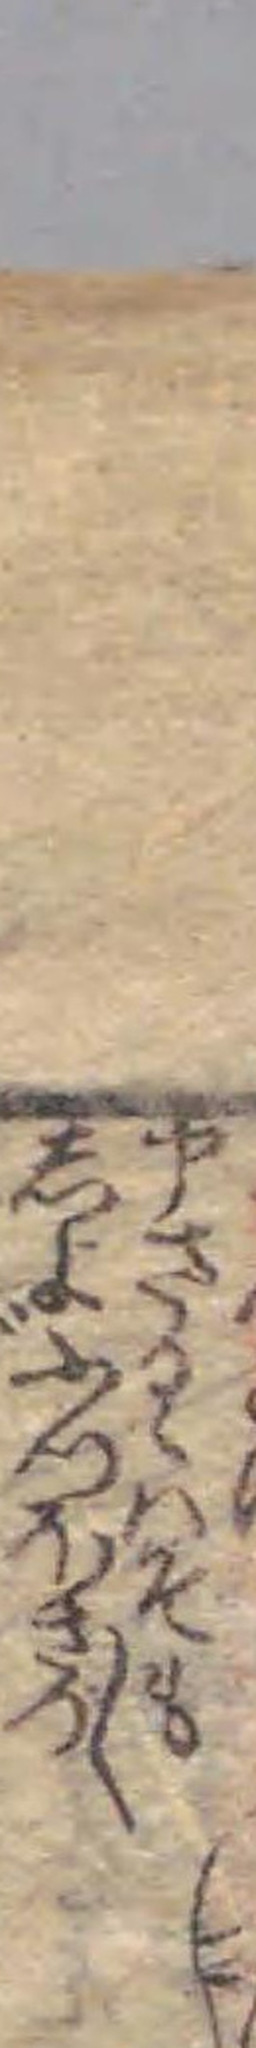しよふつほさつ
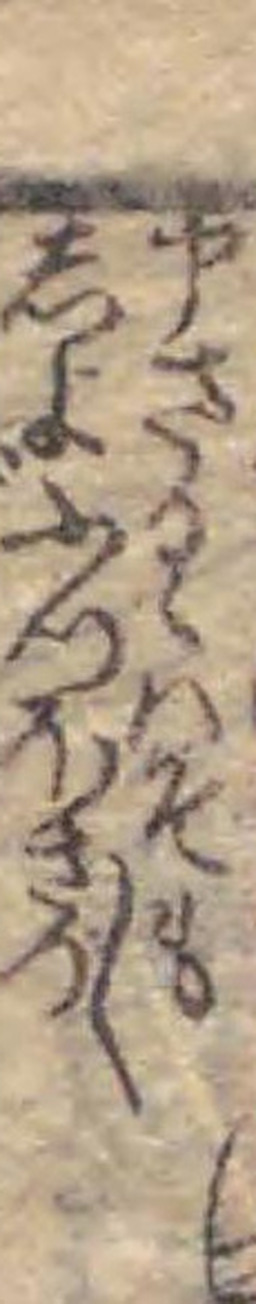しよふつほさつ
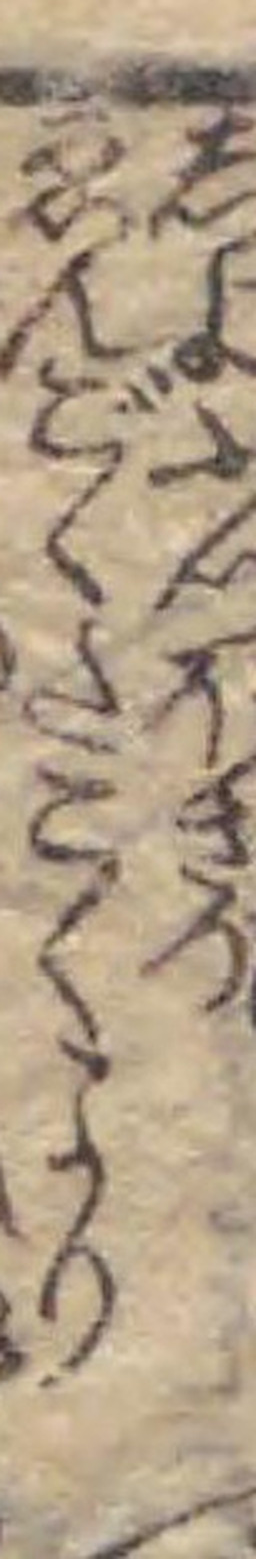ゑんごくたこくより
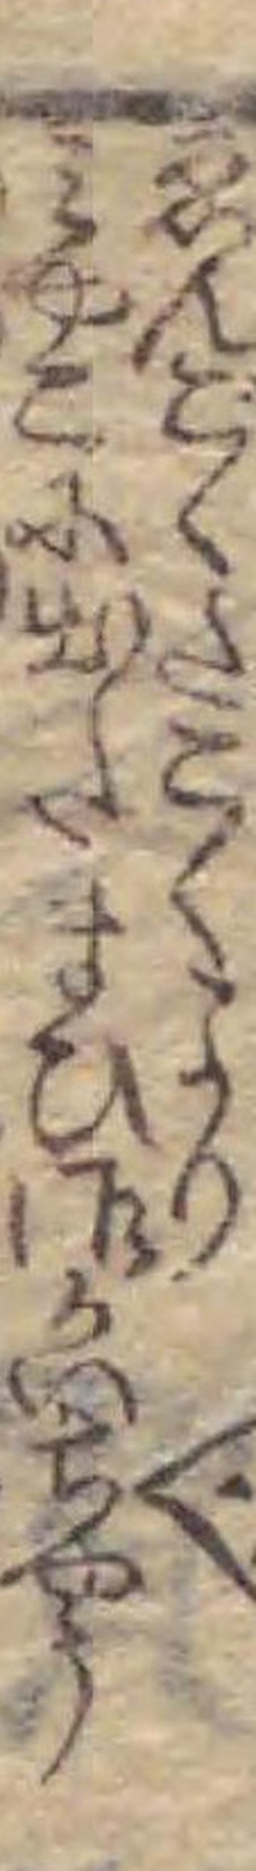みやこに出たまひ御かいちやう
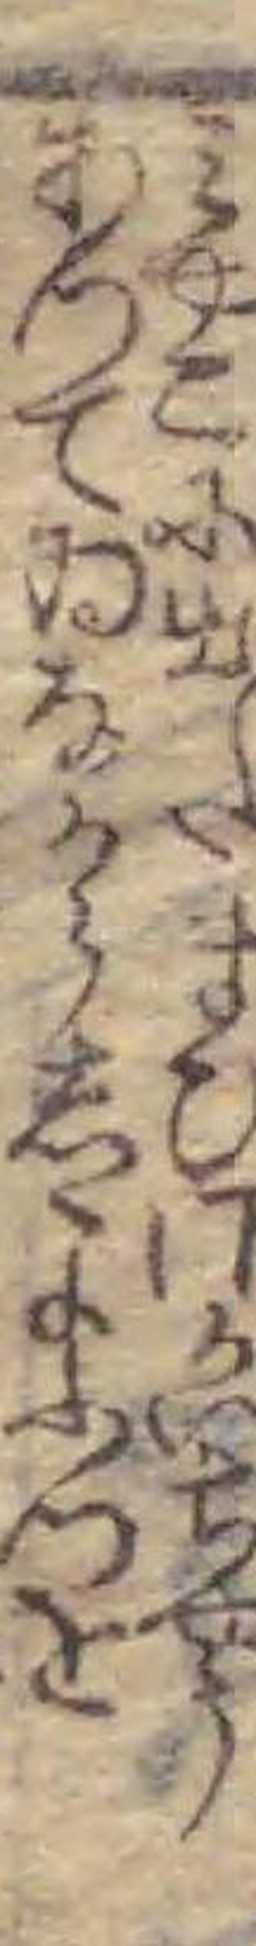あつてゐなかしよふつを
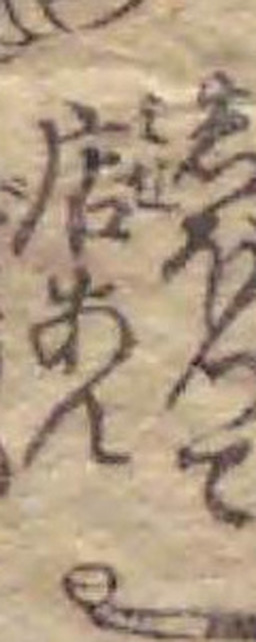店あん
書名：身体開帳略縁起 : 3巻
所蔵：国立国会図書館 National Diet Library, JAPAN
